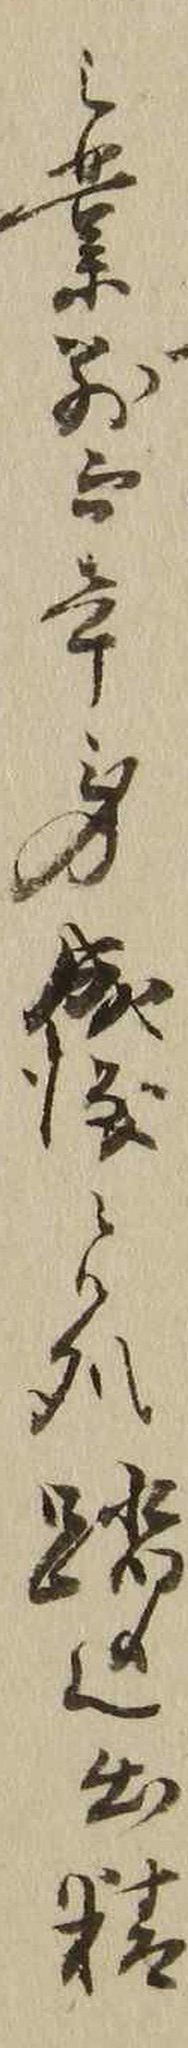之業別而辛労成儀ニ候処踏込出精
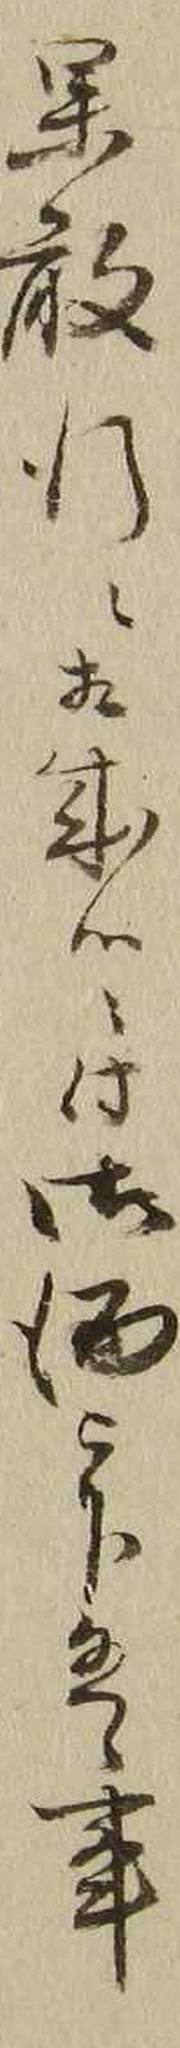果敢行ニ相成候ニ付御酒被下置候事
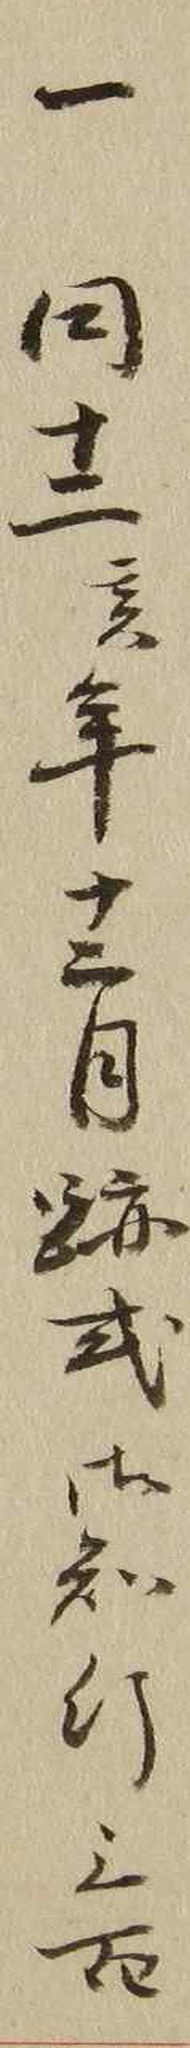一同十二亥年十二月跡式御知行三百
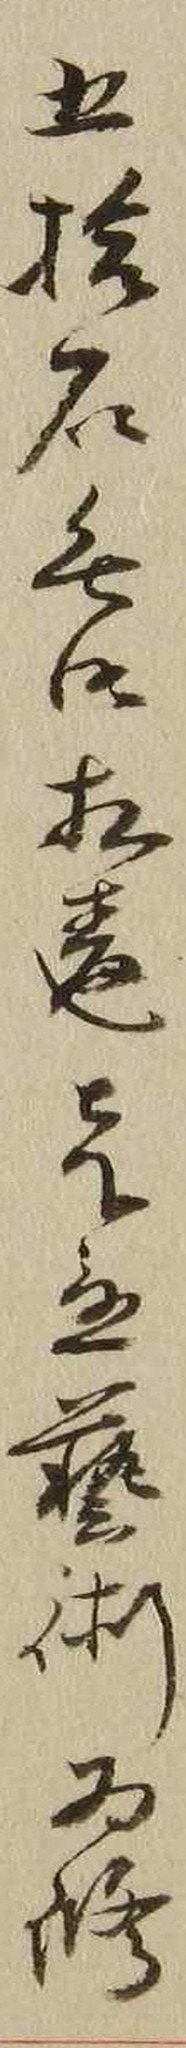五拾石無御相違被下置芸術為修
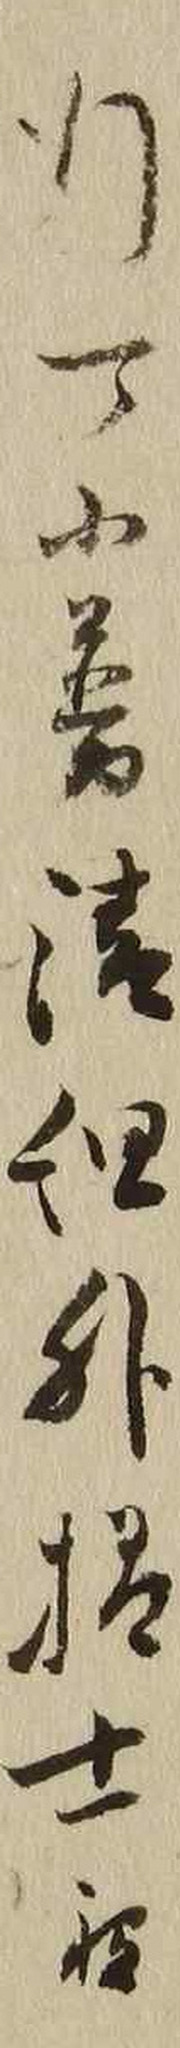行一ノ小普請組外様士被
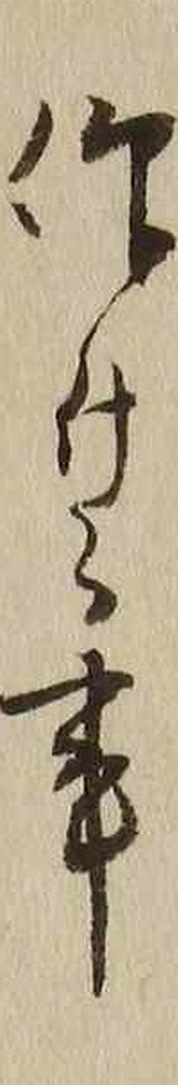仰付候事
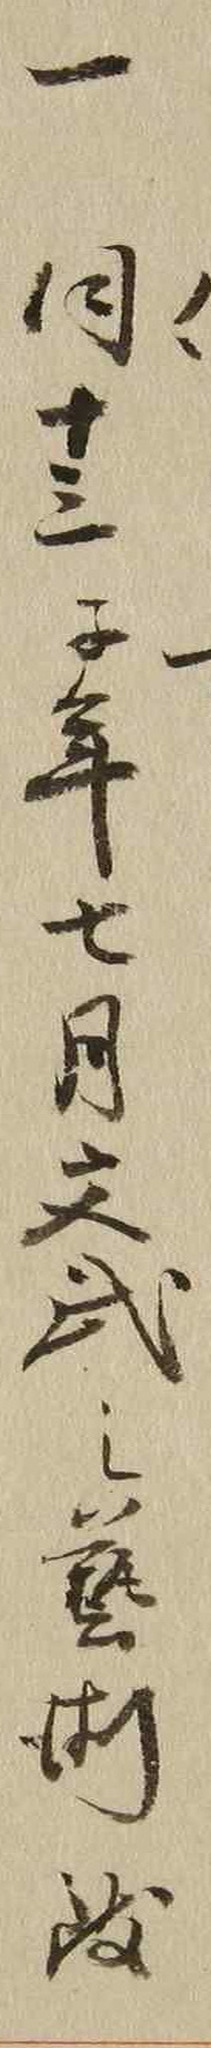一同十三子年七月文武之芸術致
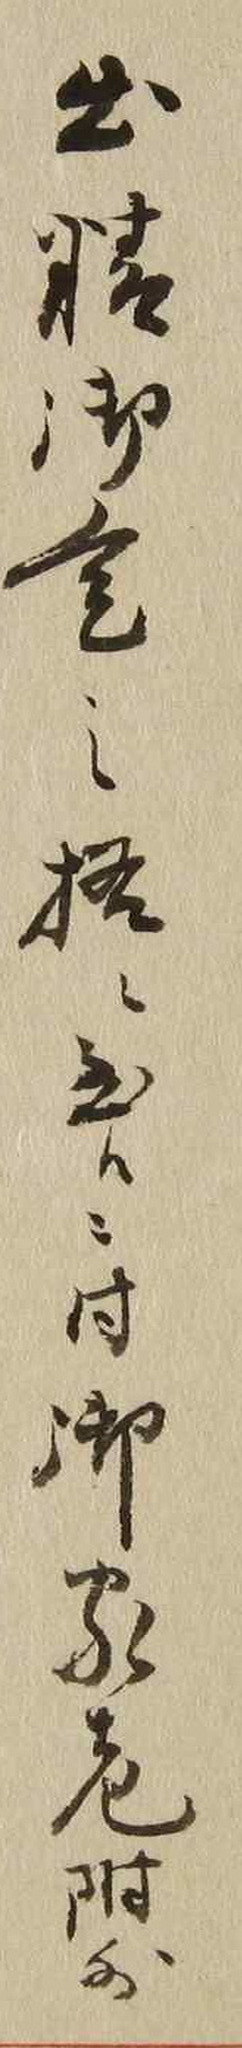出精御定之格ニ至候ニ付御家老附外
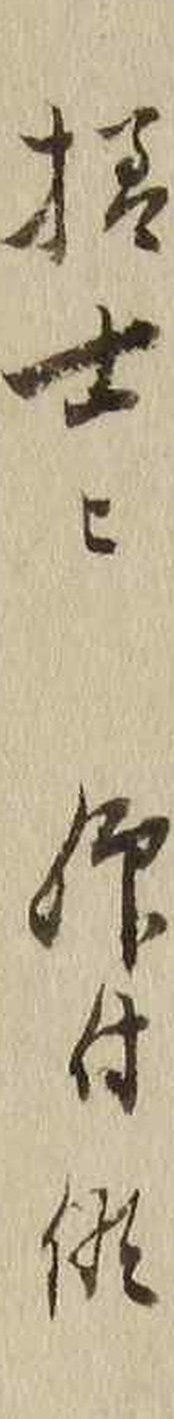様士被仰付候
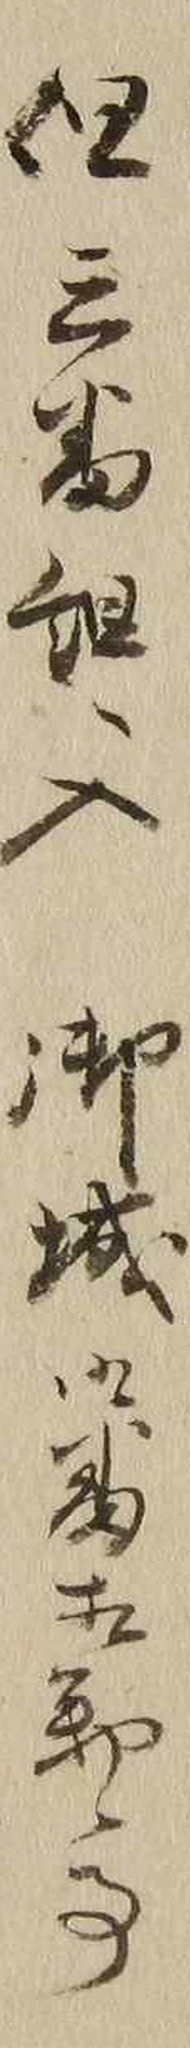但三番組へ入御城御番相勤候事
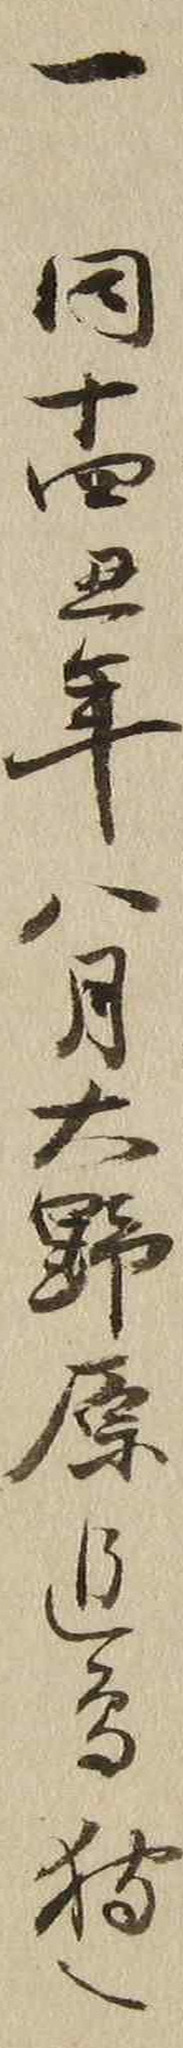一同十四丑年八月大野原追鳥狩之
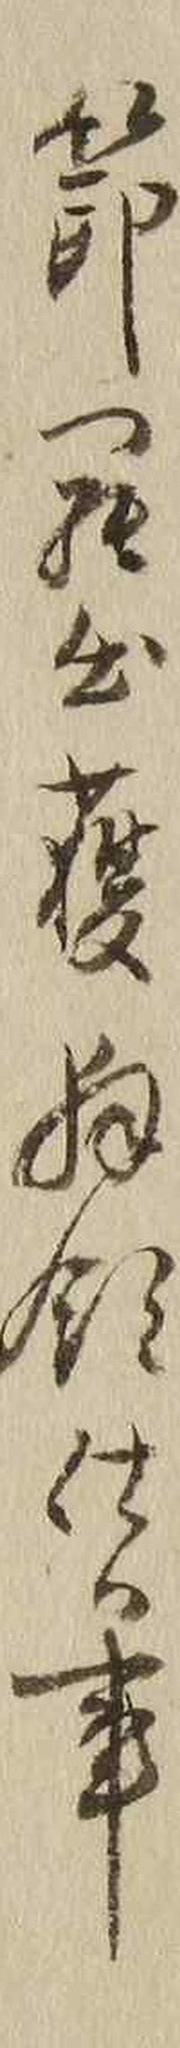節罷出獲物拝領仕候事
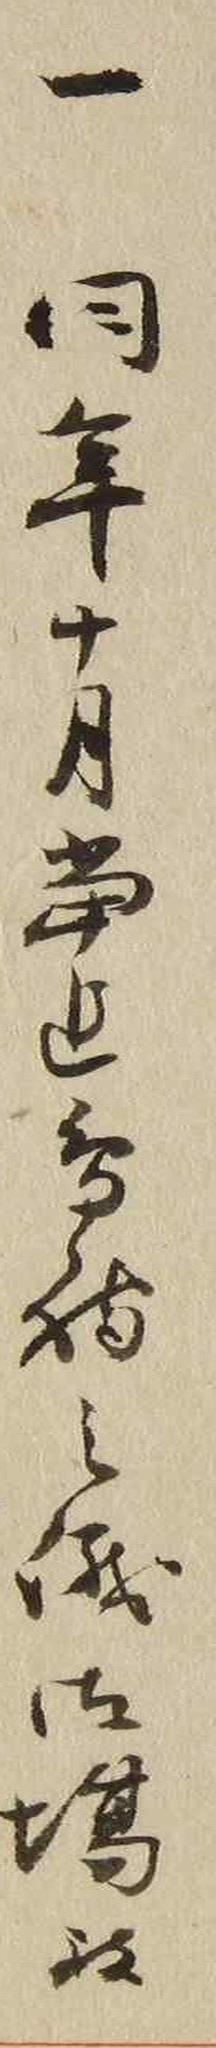一同年十月当追鳥狩之儀御場被
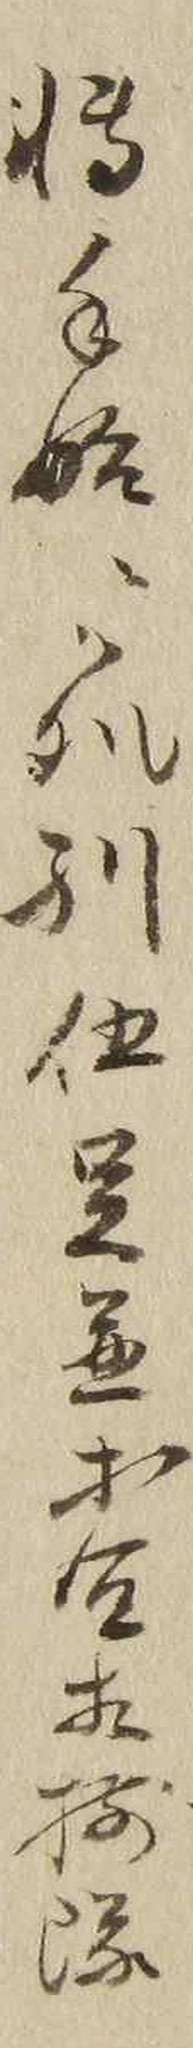転手始ニ候処列伍足並等宜相揃隊
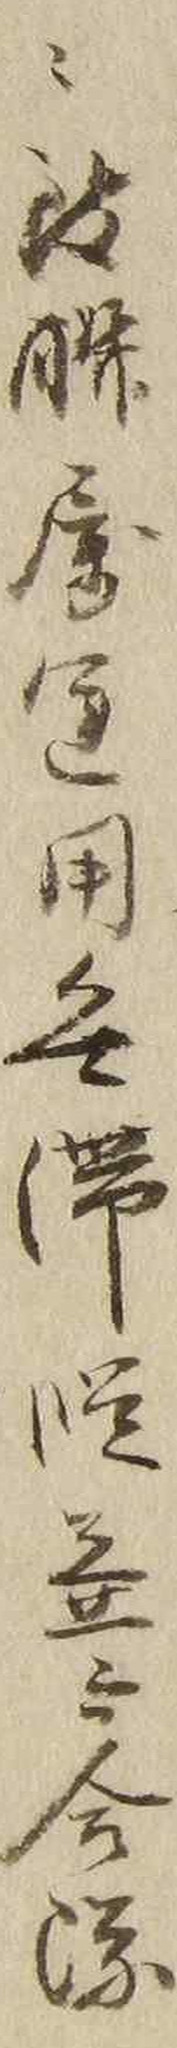々致聯属運用無滞段兼而合隊
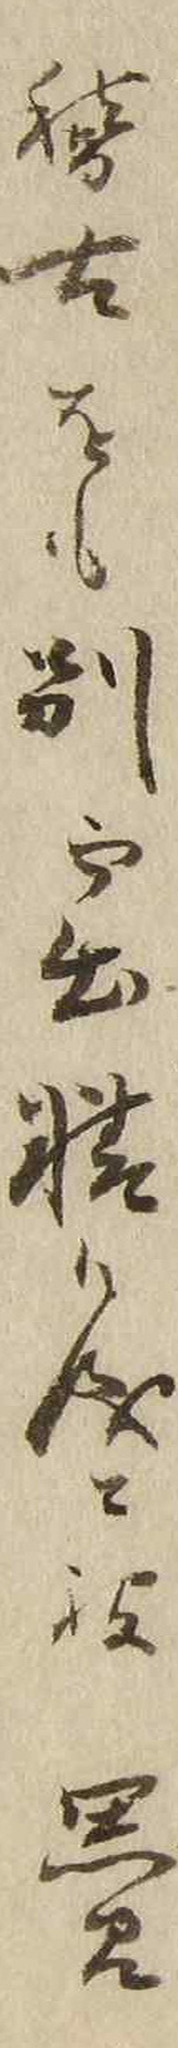稽古をも別而出精候儀と被思召
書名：諸士系譜　巻之225　ま之部6
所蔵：会津若松市立会津図書館
